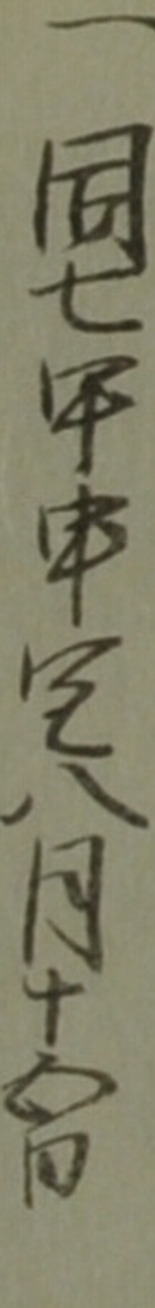一同七甲申閏八月十五日
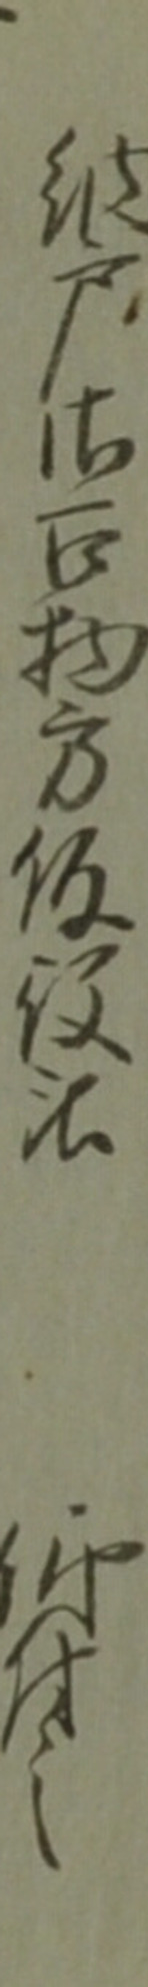納戸御召物方仮役被仰付之
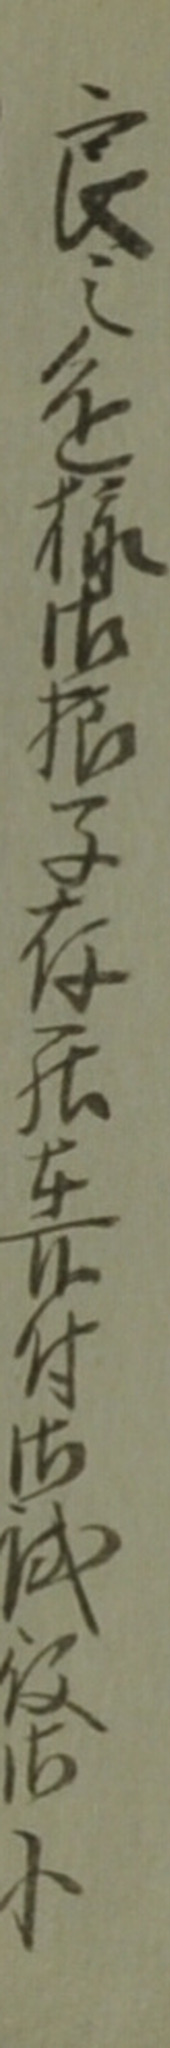良之進様御様子存罷在候付御試役御小
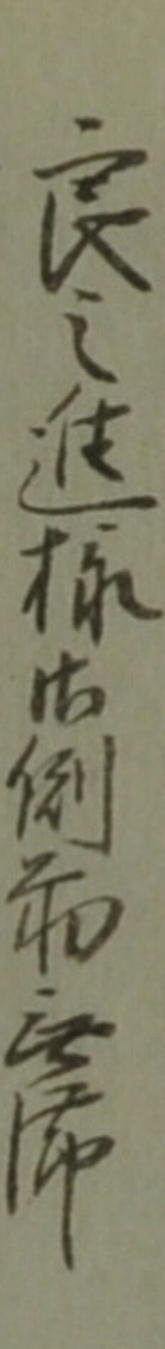良之進様御側勤無滞
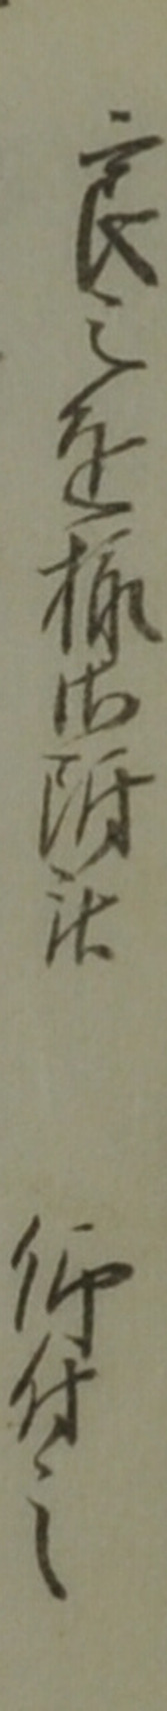良之進様御附被仰付之
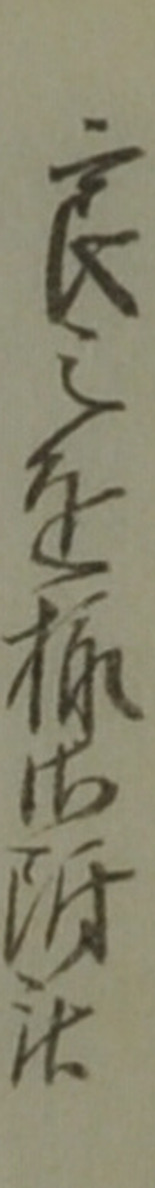良之進様御附ゟ
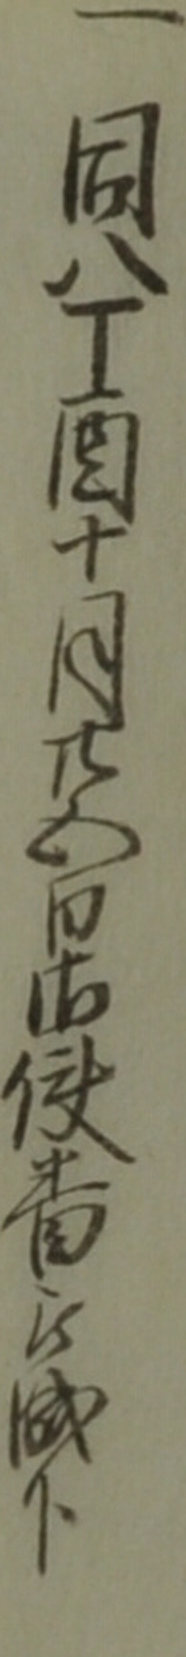一同八丁酉十月廿五日御使番被成下
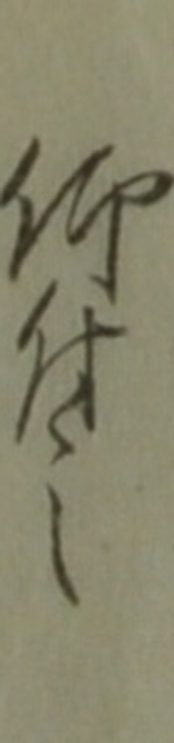仰付之
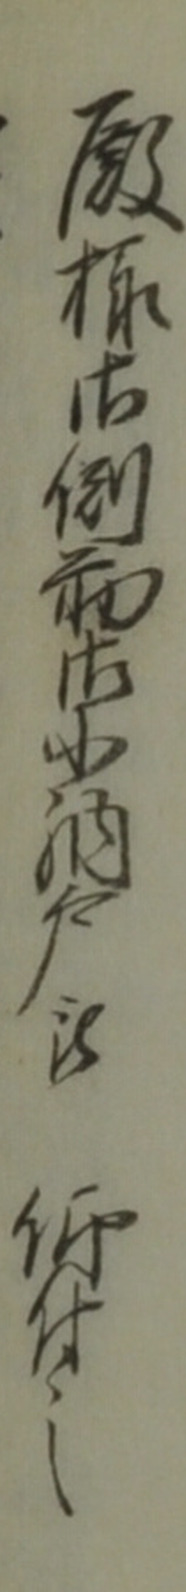殿様御側御小納戸被仰付之
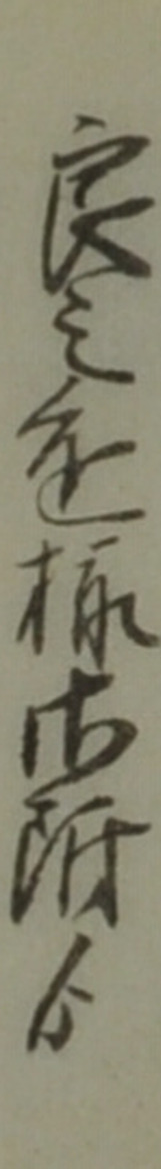良之進様御附ゟ
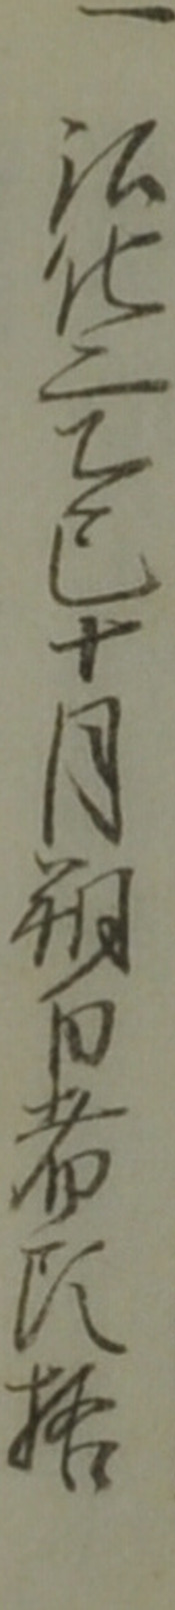一弘化二乙巳十月朔日者頭格
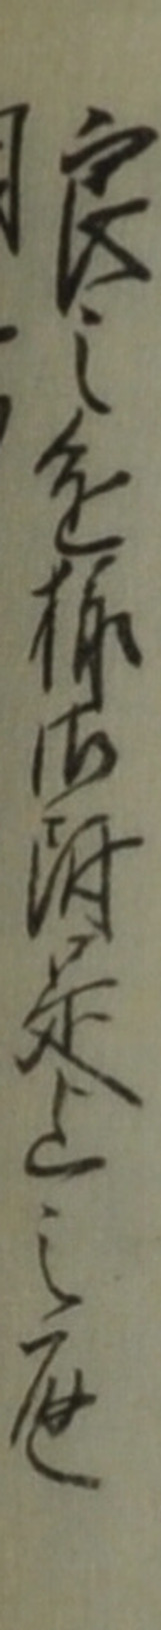良之進様御附是迄之通
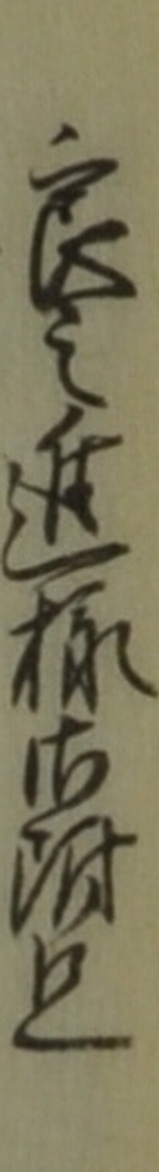良之進様御附ゟ
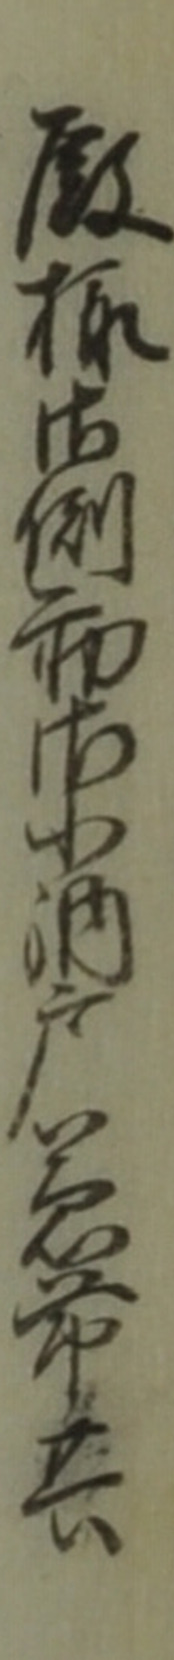殿様御側勤御小納戸兼帯共
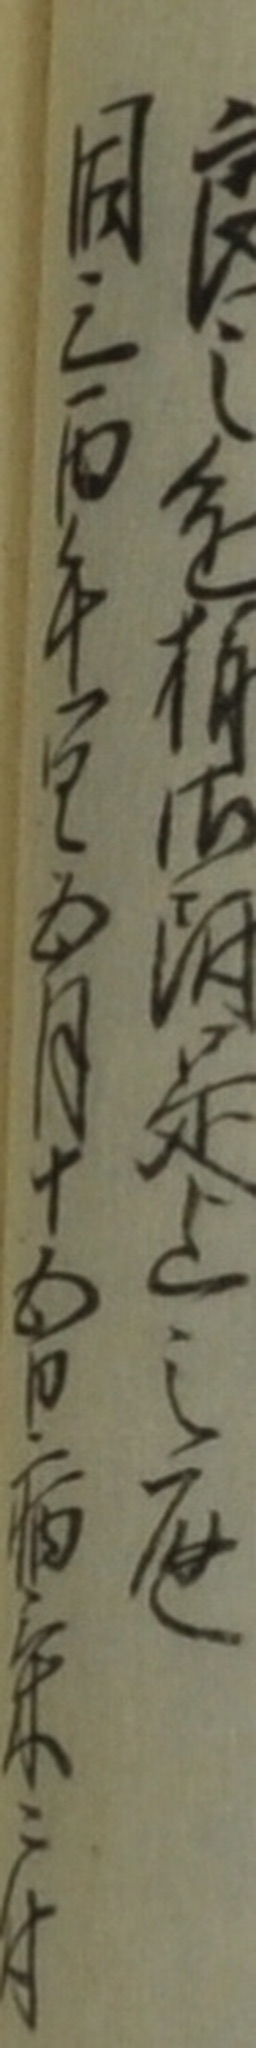一同三丙午閏五月十五日病気ニ付
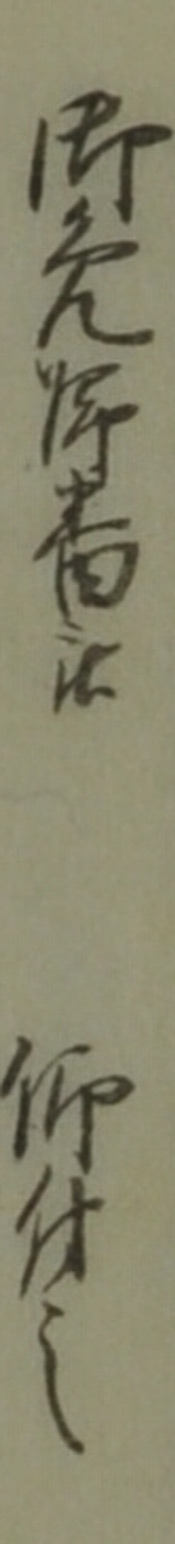御免帰番被仰付之
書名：諸御役代々録（五）
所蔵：伊那市立高遠町図書館・合同会社AMANE
